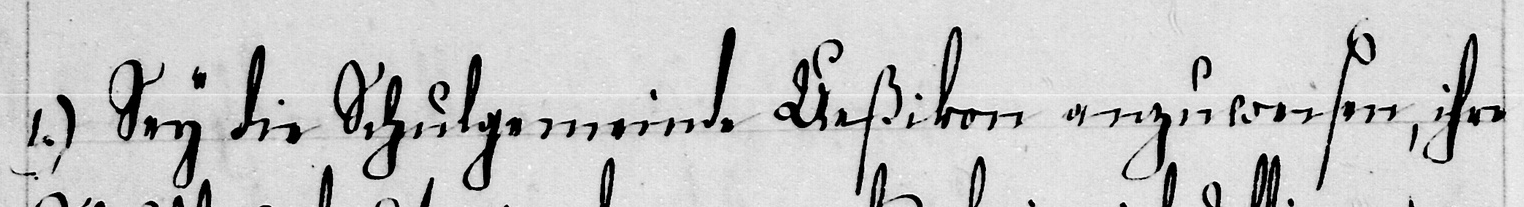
1.) Sey die Schulgemeinde Ueßikon anzuweisen, ihre
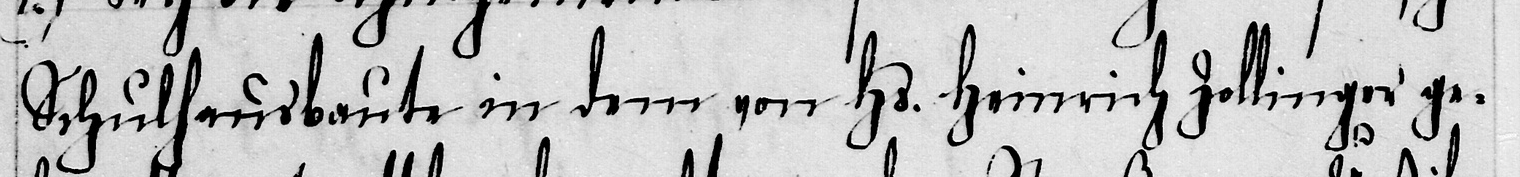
Schulhausbaute in dem von Hs. Heinrich Zollinger ge¬
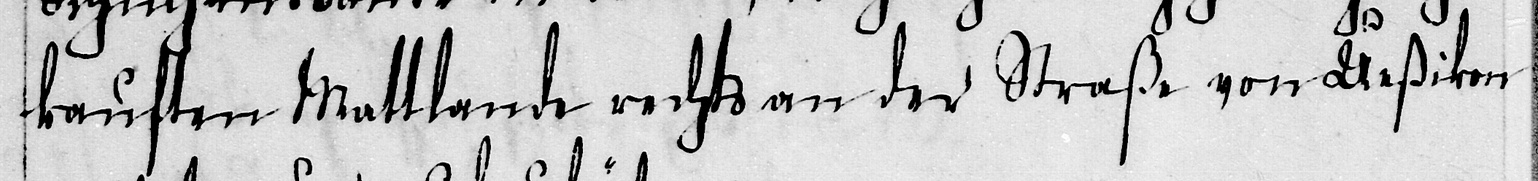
kauften Mattlande rechts an der Straße von Ueßikon
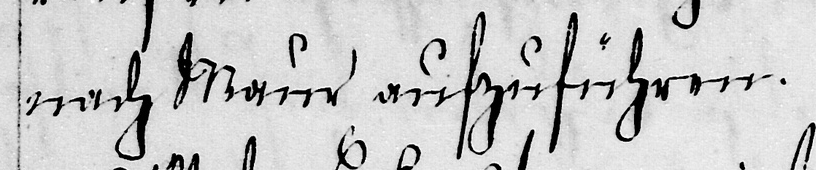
nach Maur aufzuführen.
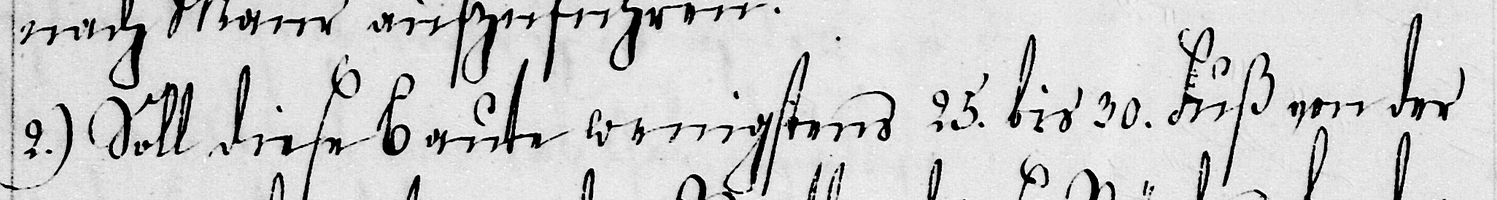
2.) Soll diese Baute wenigstens 25. bis 30. Fuß von der
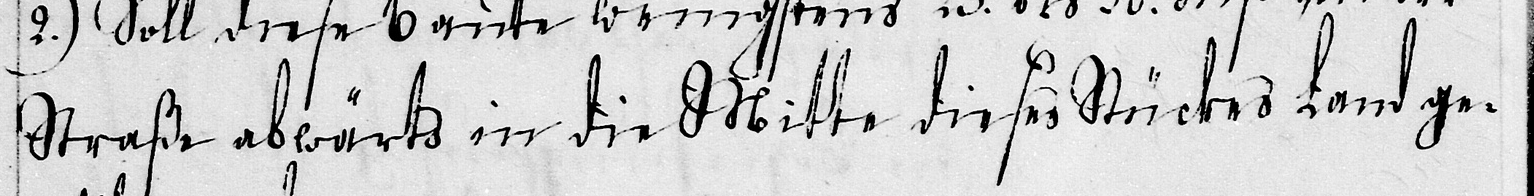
Straße abwärts in die Mitte dieses Stückes Land ge¬
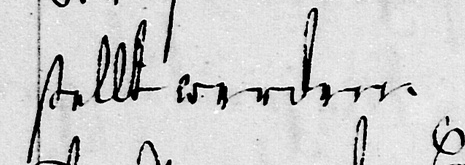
stellt werden.
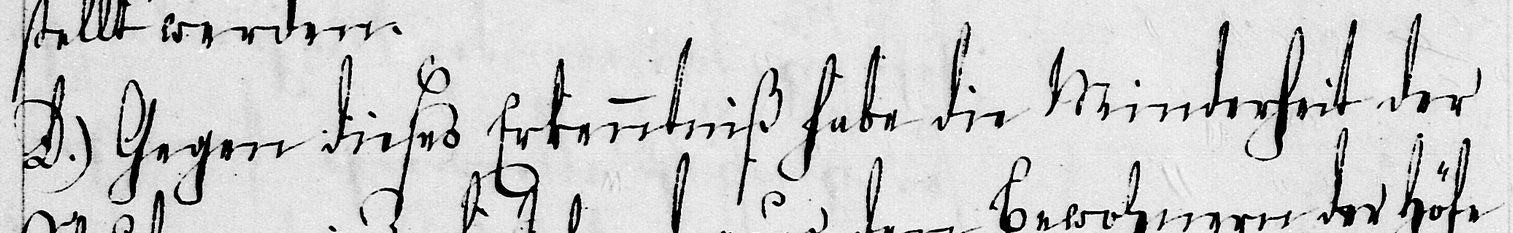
D.) Gegen dieses Erkenntniß habe die Minderheit der
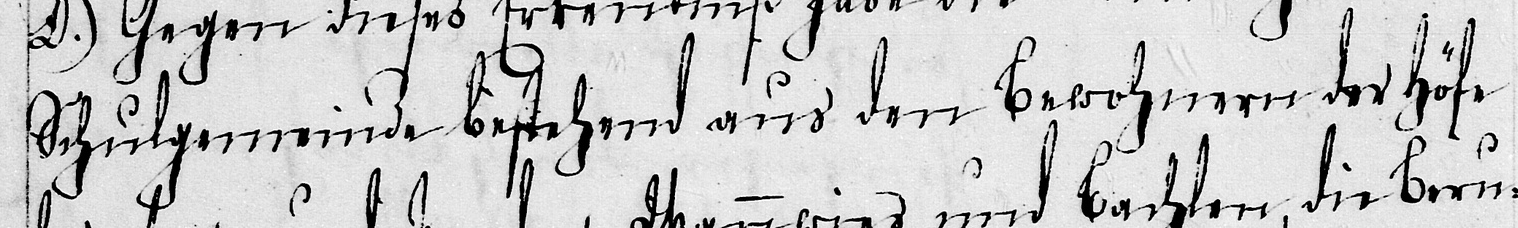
Schulgemeinde bestehend aus den Bewohnern der Höfe
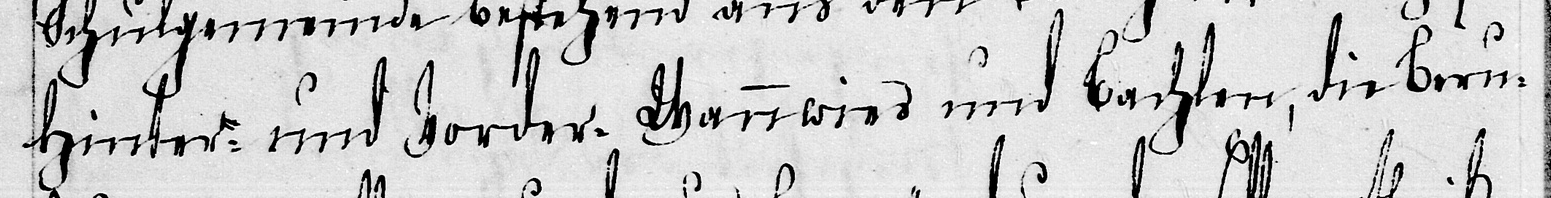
Hinter- und Vorder-Wannwies und Bachlen, die Beru¬
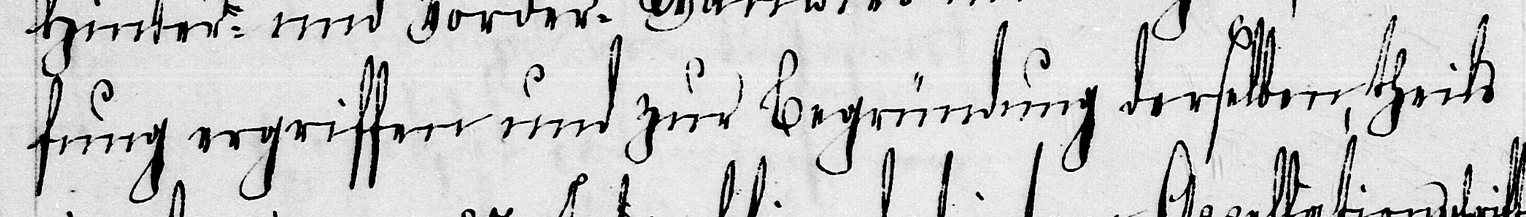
fung ergriffen und zur Begründung derselben, theils
